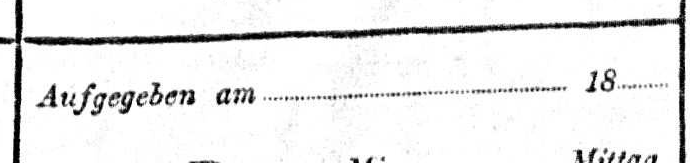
Aufgegeben am................................18....
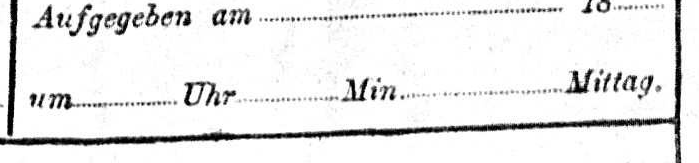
um ...............Uhr..........Min..............Mittag.
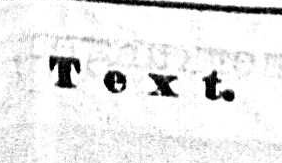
Text.
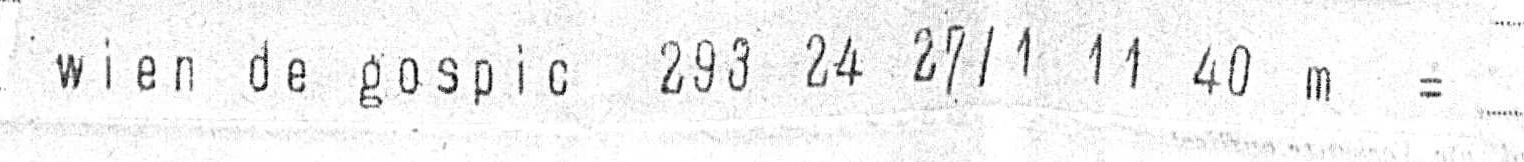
wien des gospic 293 24 27/1 11 40 m =
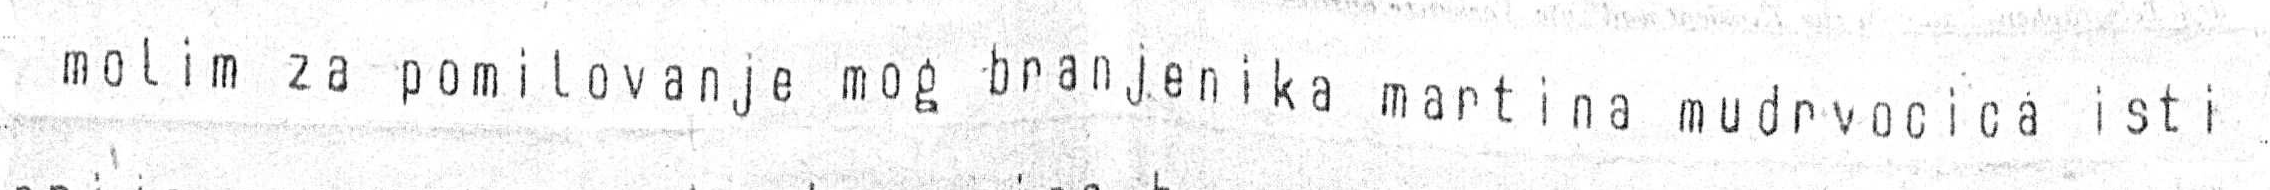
molim za pomilovanje mog branjenika martina mudrvocica isti
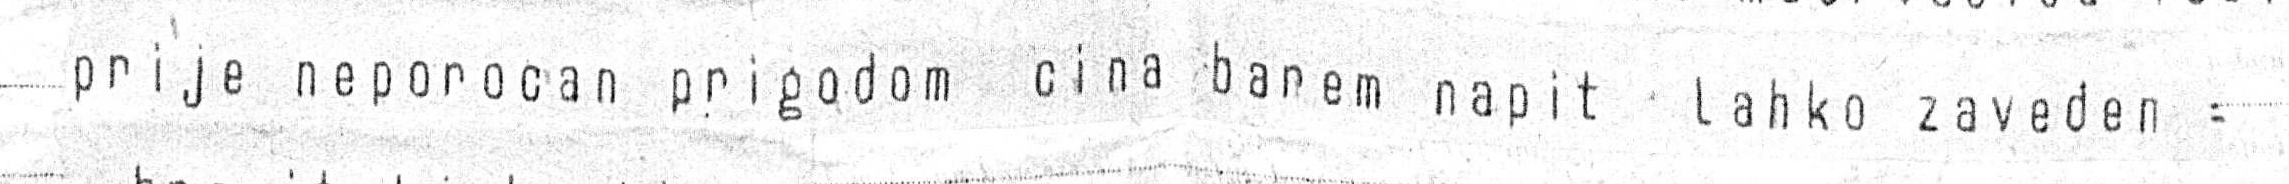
prije neporocan prigodom cina barem napit Lahko zaveden =
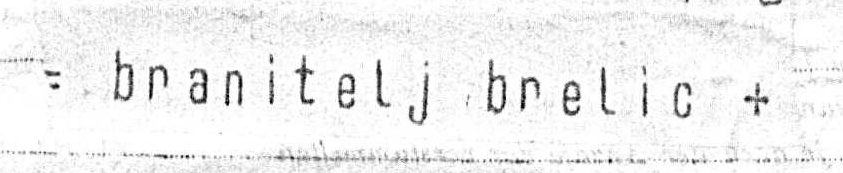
= branitelj brelic +
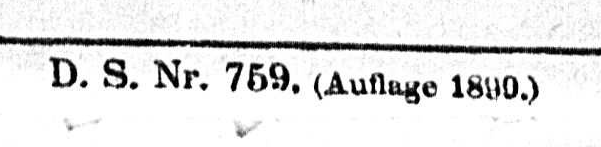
D. S. Nr. 759. (Auflage 1890.)
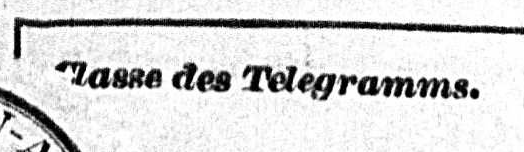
Classe des Telegramms.
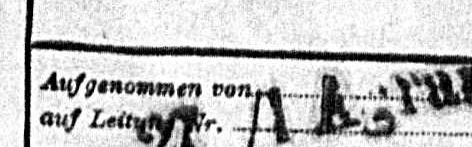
Aufgenommen von......................xx....................................................
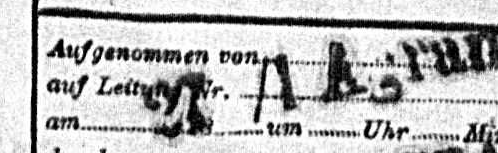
auf Leitung Nr..................................................................................
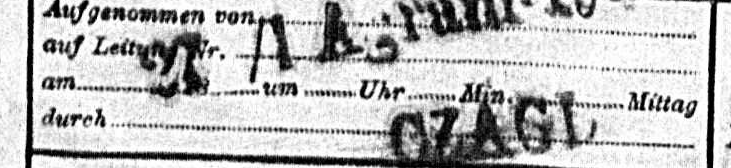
am...........18......um............Uhr..............Min........................ Mittag
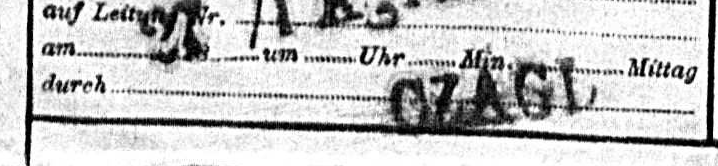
durch......................Czagl.............................................................................
